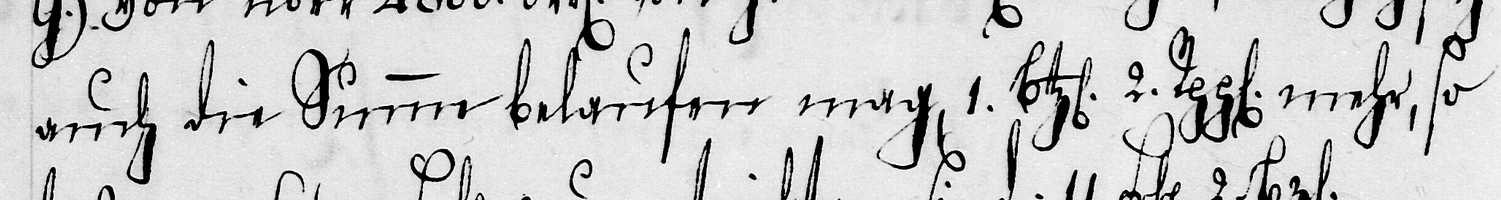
auch die Summe belaufen mag, 1. Btz[en]. 2.
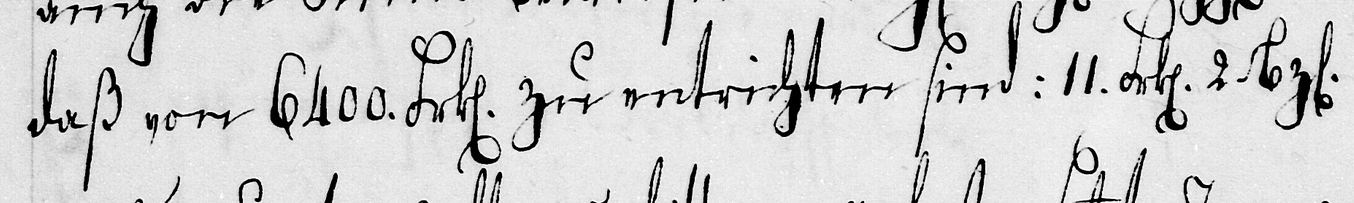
daß von 6400. Frk[en]. zu entrichten sind: 11. Frk[en]. 2.
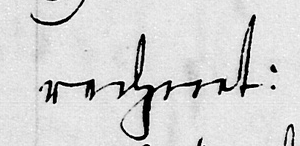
rechnet:
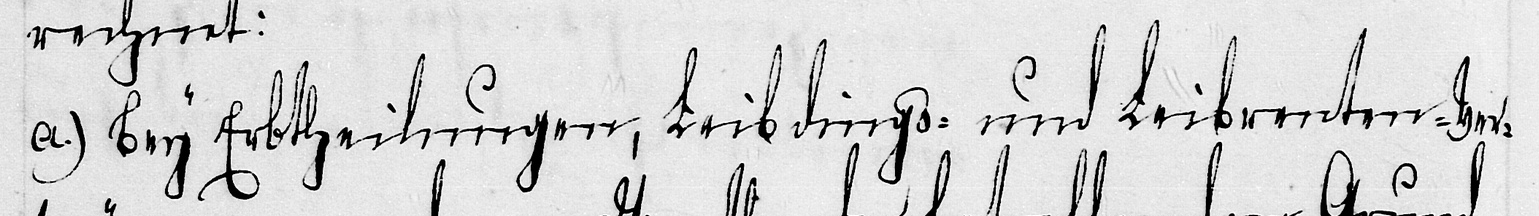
a.) Bey Erbtheilungen, Leibdings- und Leibrenten-Ver¬
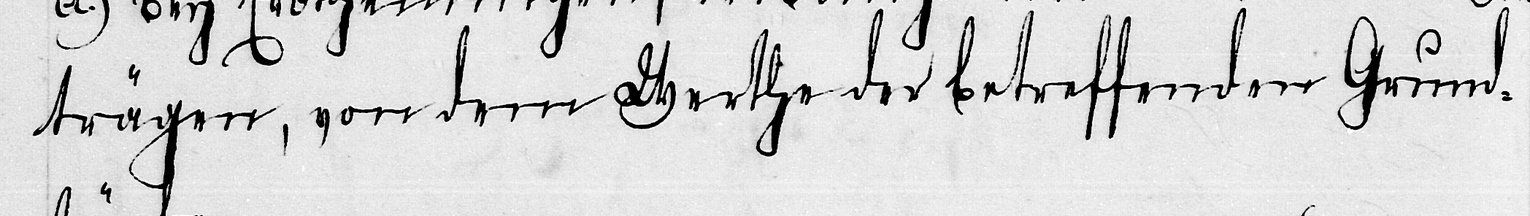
trägen, von dem Werthe der betreffenden Grund¬
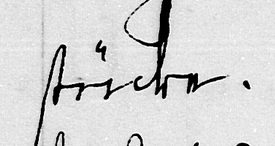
stücke.
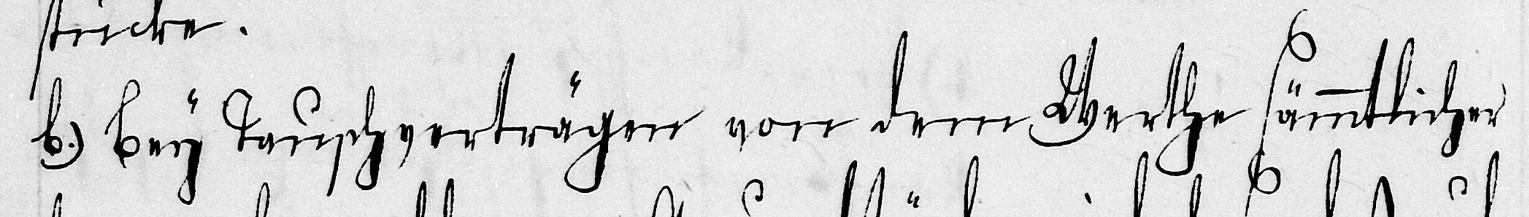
b.) Bey Tauschverträgen von dem Werthe sämmtlicher
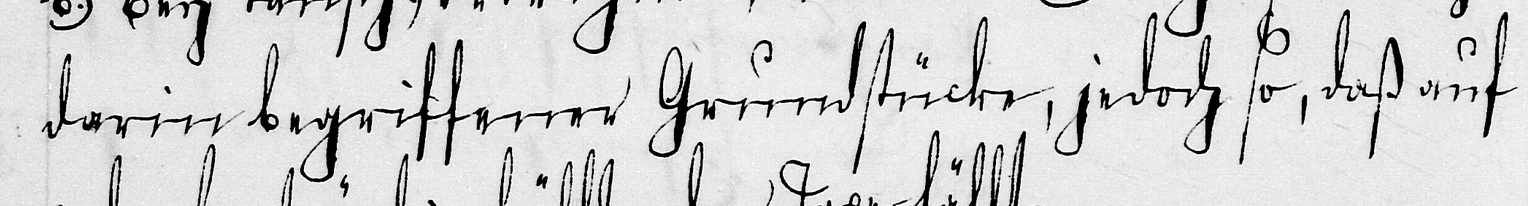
darin begriffener Grundstücke, jedoch so, daß auf
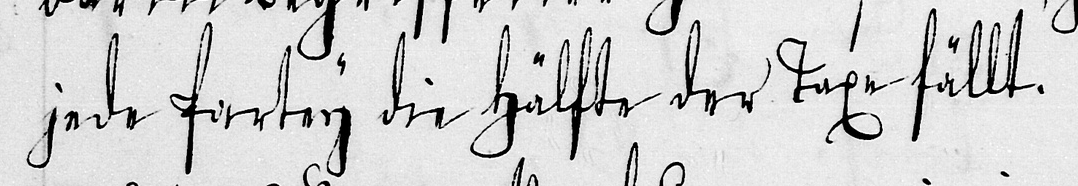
jede Partey die Hälfte der Taxe fällt.
